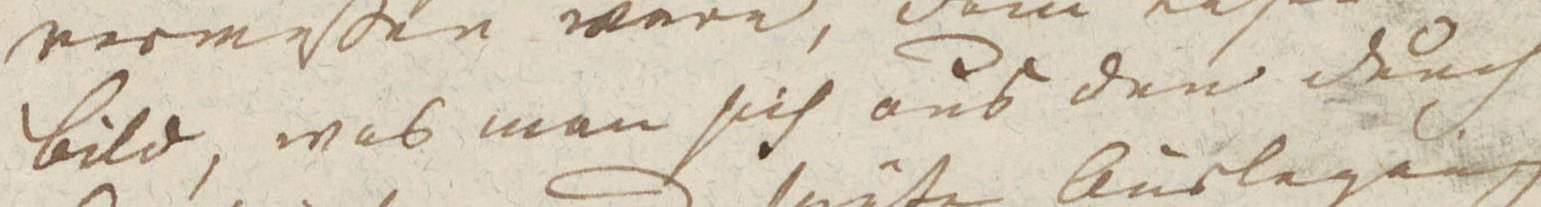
Bild, was man sich aus den durch
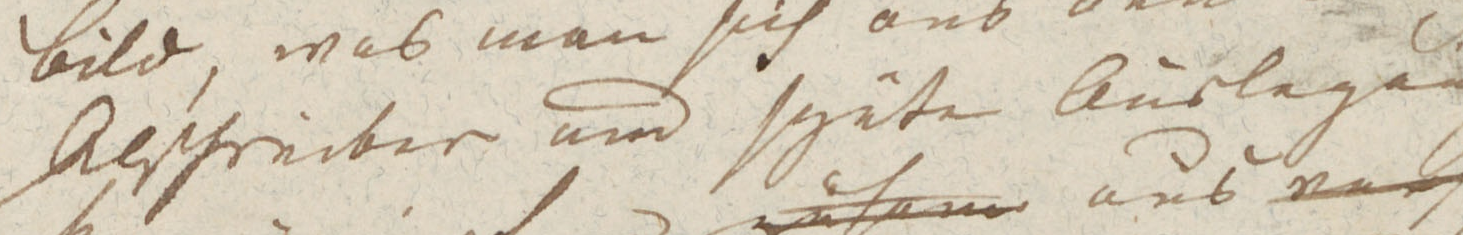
Abschreiber und späte Auslegung
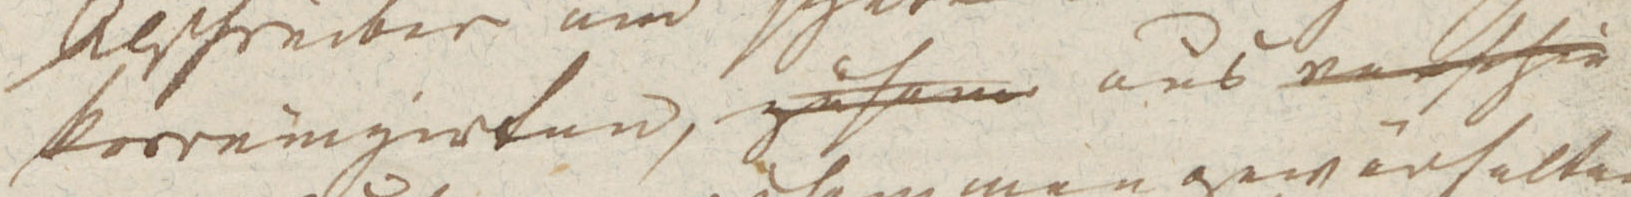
korrumpirten, zusam aus verschie-
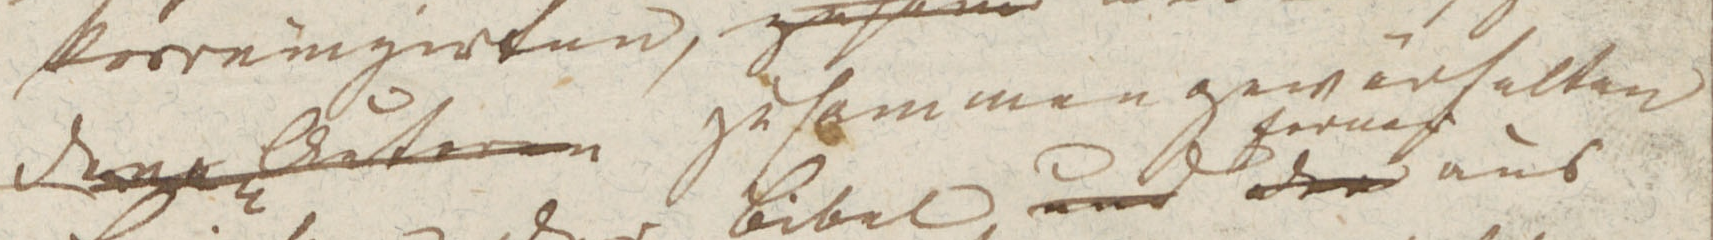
denen Autoren zusammengewürfelten
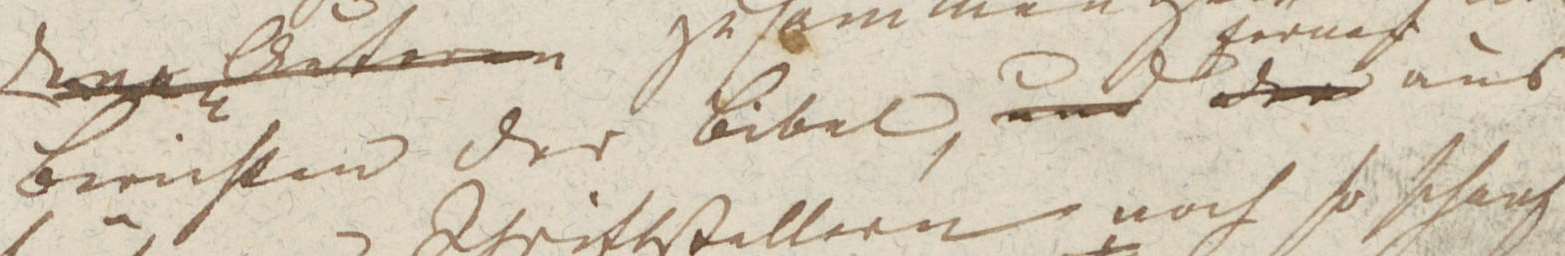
Berichten der Bibel, und der ferner aus
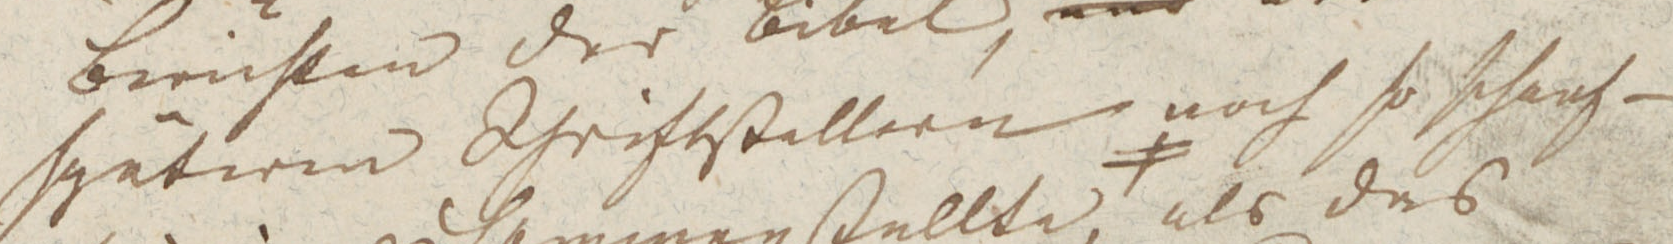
späteren Schriftstellern noch so scharf-
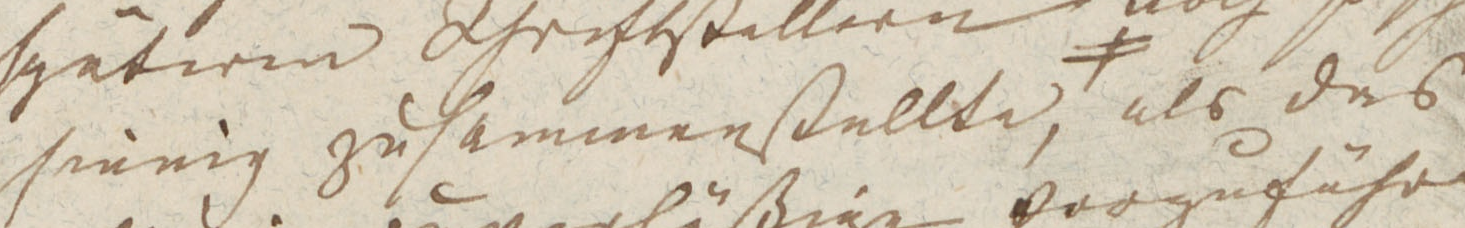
sinnig zusammenstellte, % als das
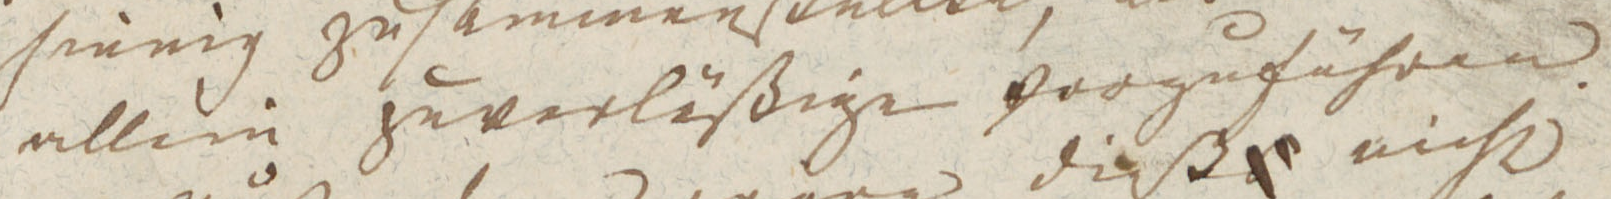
allein zuverlässige vorzuführen.
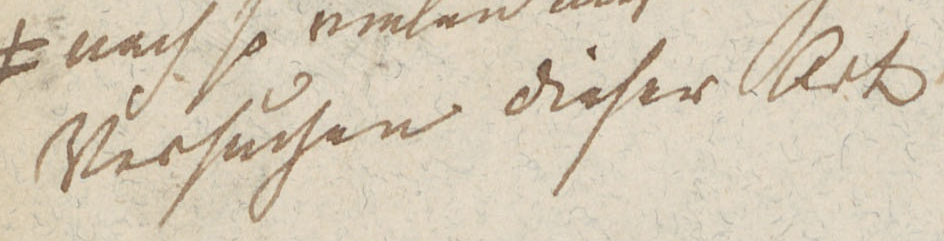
Versuchen dieser Art,
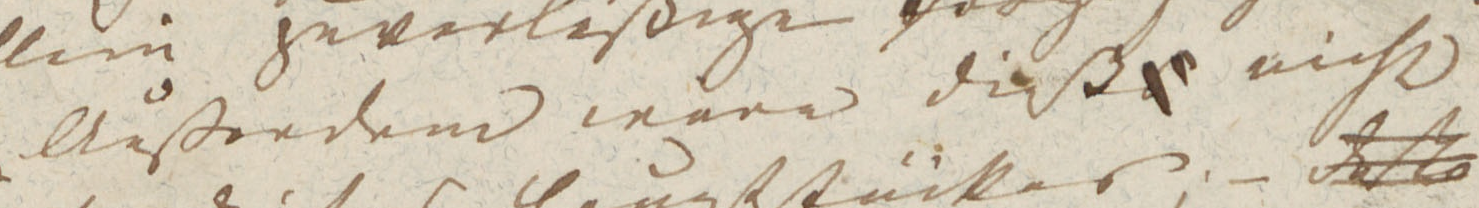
Ausserdem wäre diesses nicht
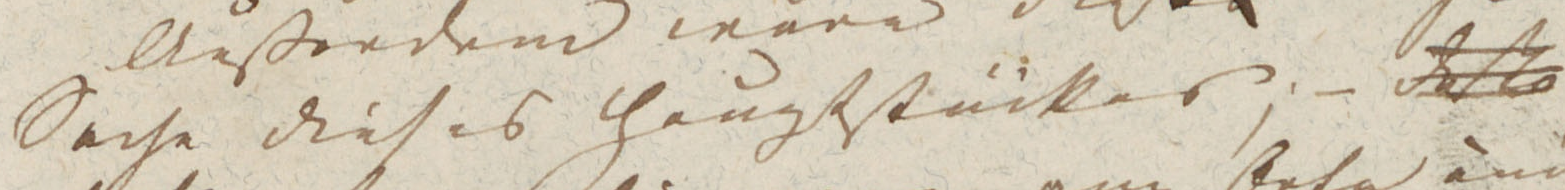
Sache dieses Hauptstückes; – desto
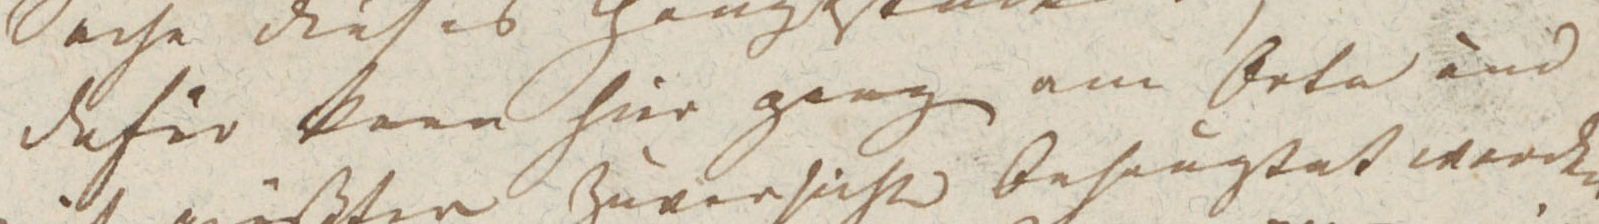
dafür kann hier ganz am Orte und
